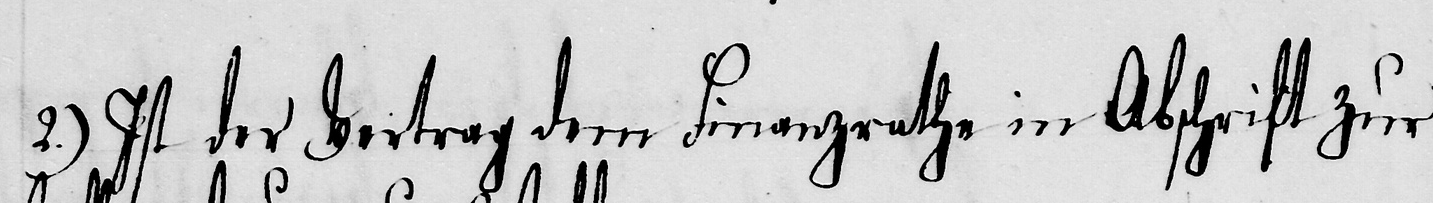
2.) Ist der Vertrag dem Finanzrathe in Abschrift zur
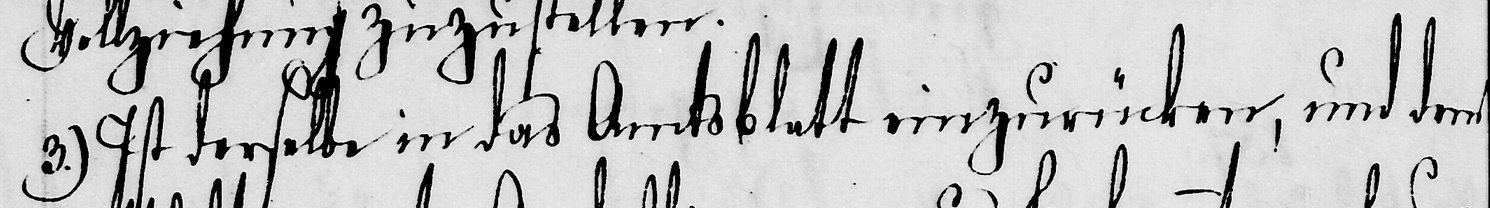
3.) Ist derselbe in das Amtsblatt einzurücken, und dem
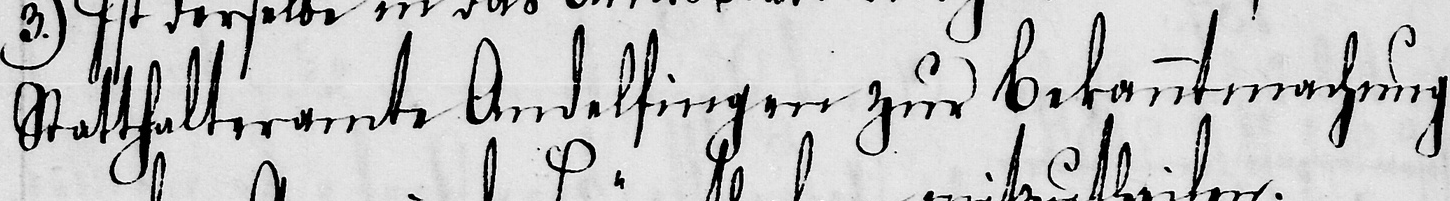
Statthalteramte Andelfingen zur Bekanntmachung
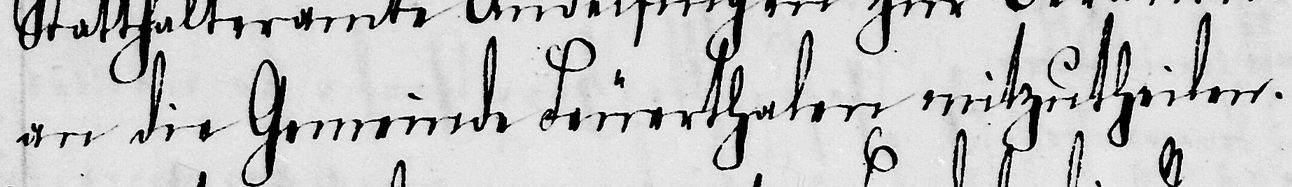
an die Gemeinde Feuerthalen mitzutheilen.
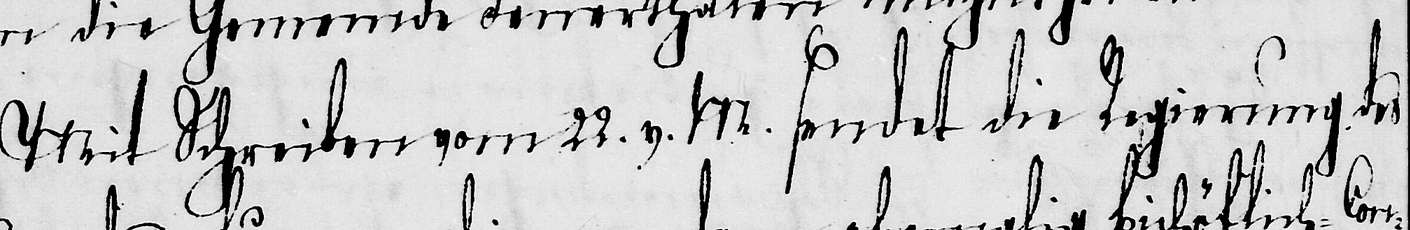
Mit Schreiben vom 22 v. M. sendet die Regierung des
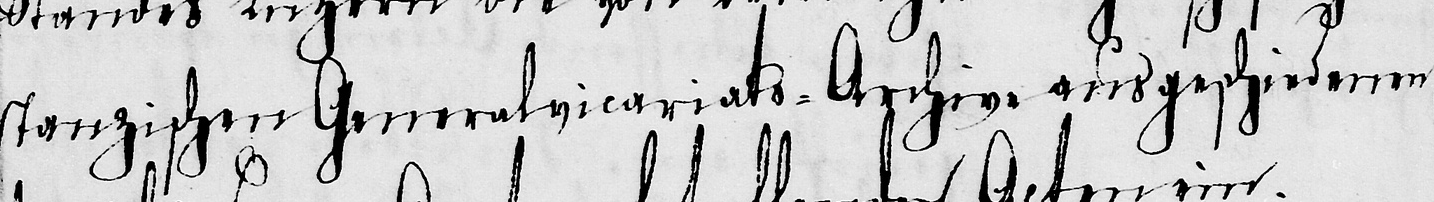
tanzischen Generalvicariats-Archive ausgeschiedenen,
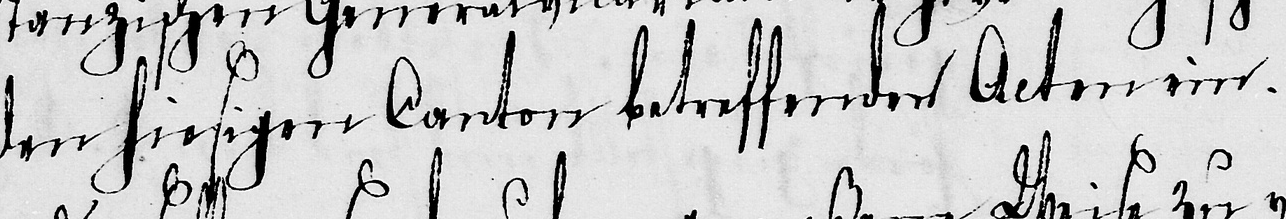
den hiesigen Canton betreffenden Acten ein.
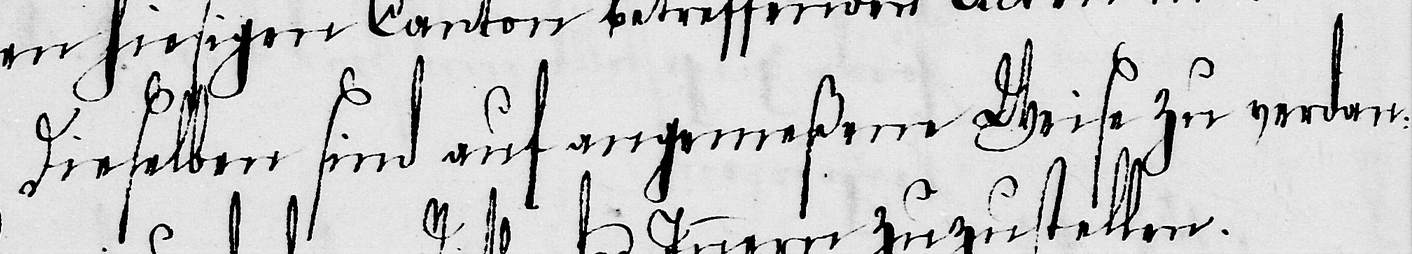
Dieselben sind auf angemeßene Weise zu verdan¬
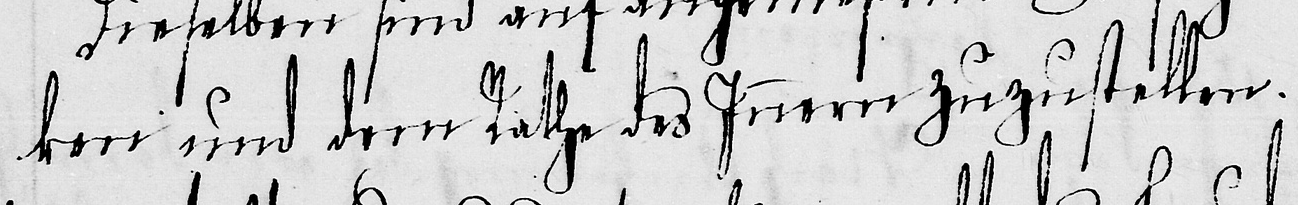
ken und dem Rathe des Innern zuzustellen.
